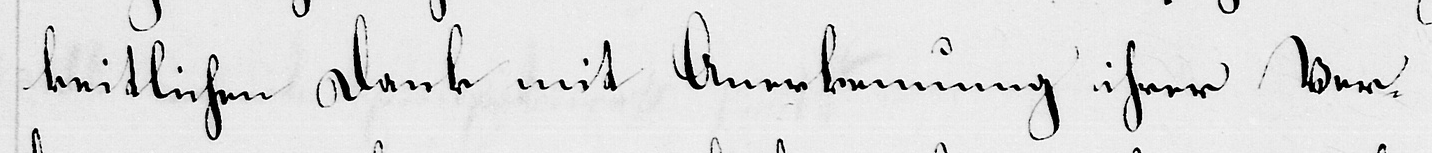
keitlichen Dank mit Anerkennung ihrer Ver¬
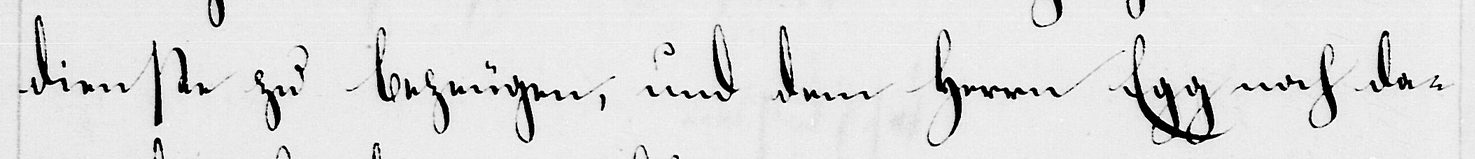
dienste zu bezeugen, und dem Herrn Egg noch da¬
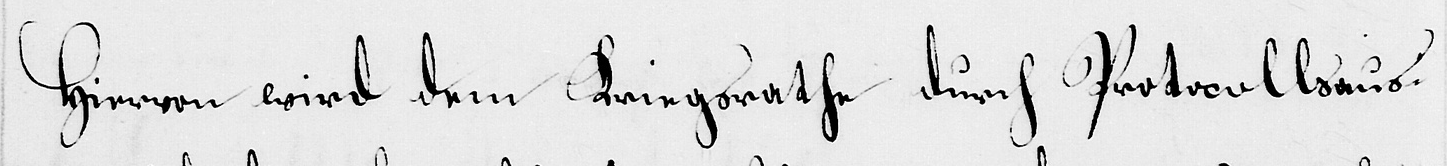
Hiervon wird dem Kriegsrathe durch Protocollsaus¬
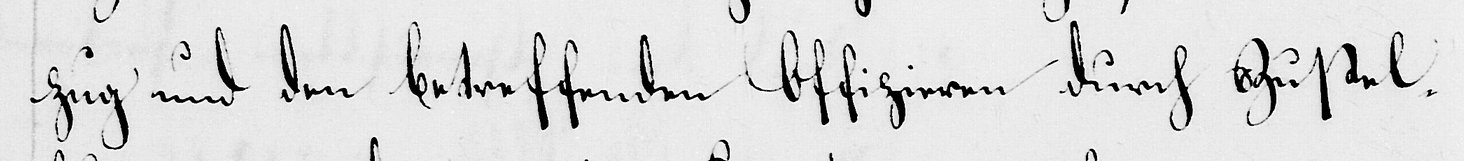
zug und den betreffenden Offizieren durch Zustel¬
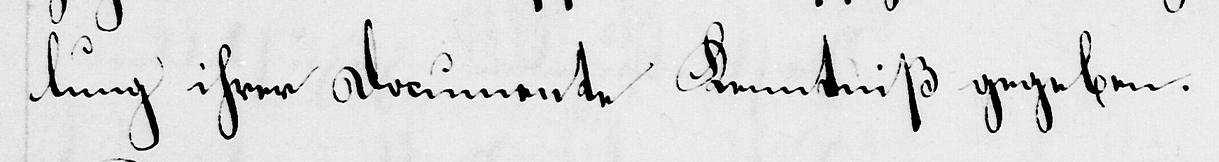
lung ihrer Documente Kenntniß gegeben.
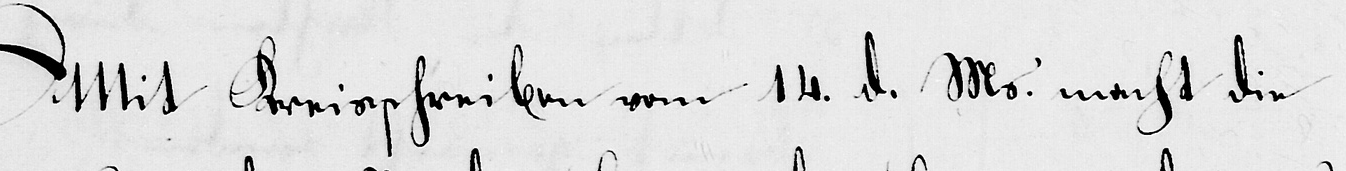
Mit Kreisschreiben vom 14. d. Ms. macht die
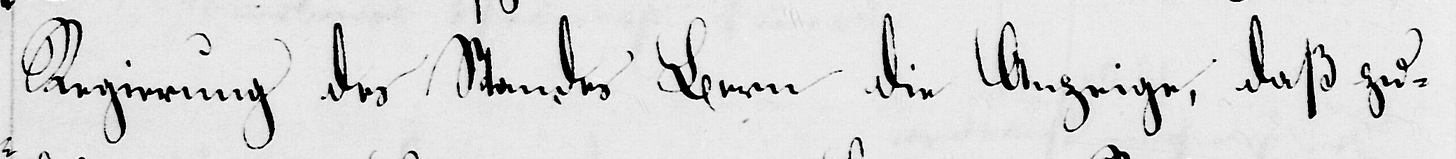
Regierung des Standes Bern die Anzeige, daß zu¬
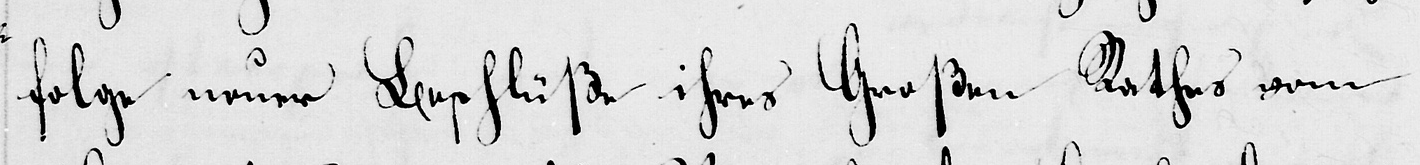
folge neuer Beschlüße ihres Großen Rathes vom
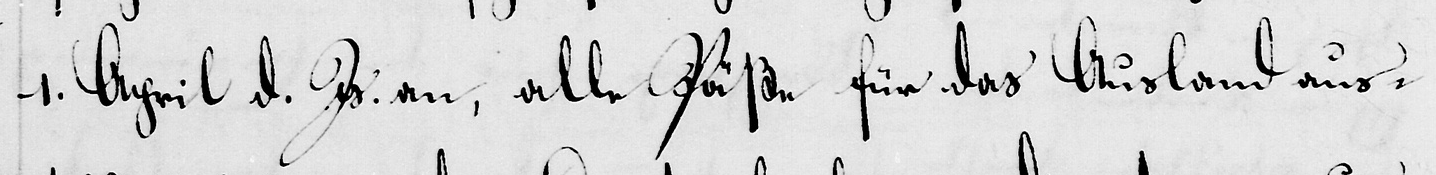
1. April d. Js. an, alle Päße für das Ausland aus¬
